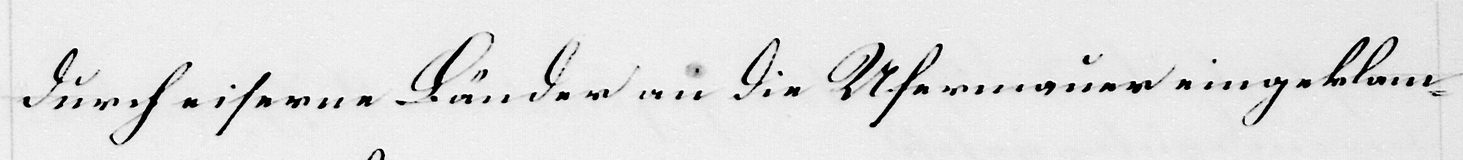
durch eiserne Bänder an die Ufermauer eingeklam¬
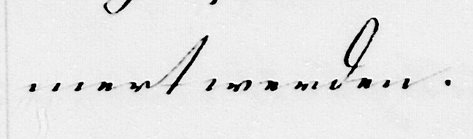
mert werden.
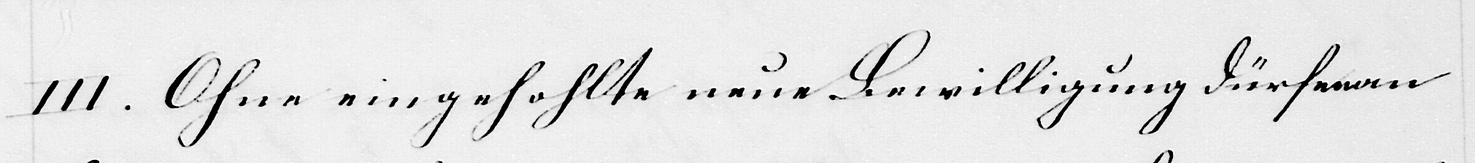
III. Ohne eingehohlte neue Bewilligung dürfen an
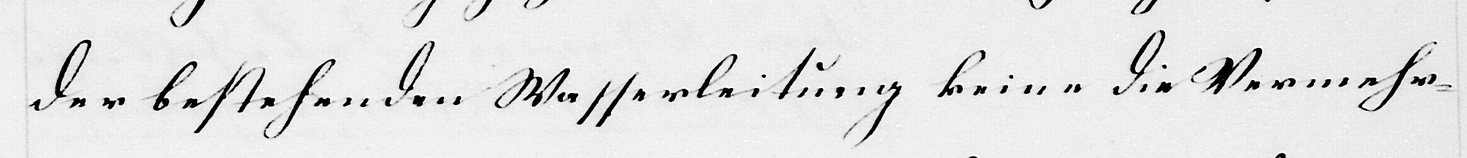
der bestehenden Wasserleitung keine die Vermehr¬
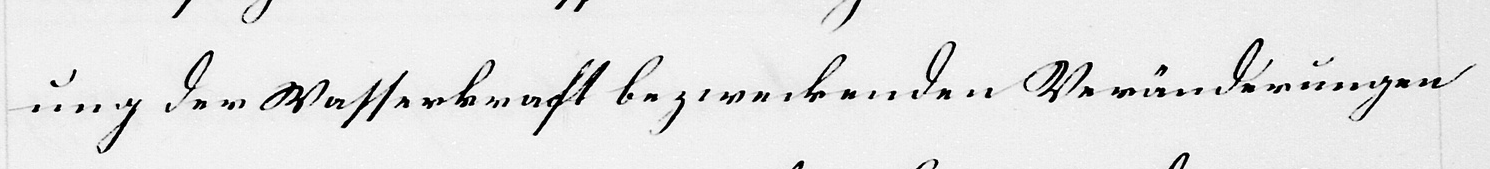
ung der Wasserkraft bezweckenden Veränderungen
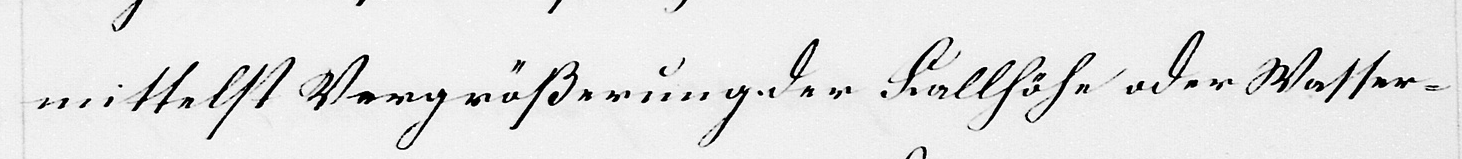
mittelst Vergrößerung der Fallhöhe oder Wasser¬
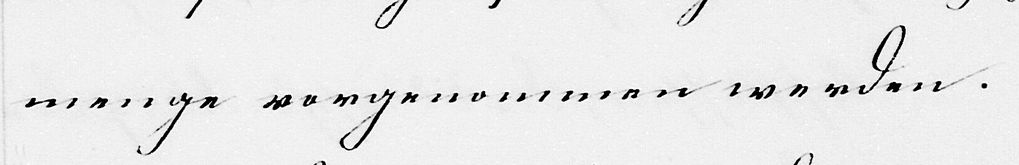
menge vorgenommen werden.
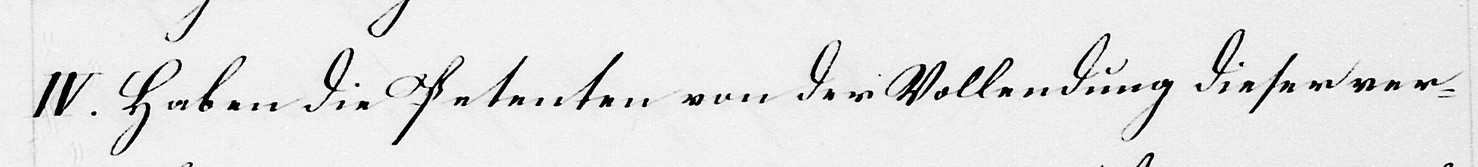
IV. Haben die Petenten von der Vollendung dieser ver¬
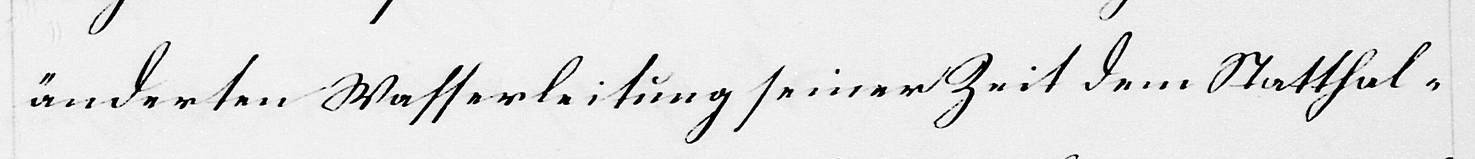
änderten Wasserleitung seiner Zeit dem Statthal¬
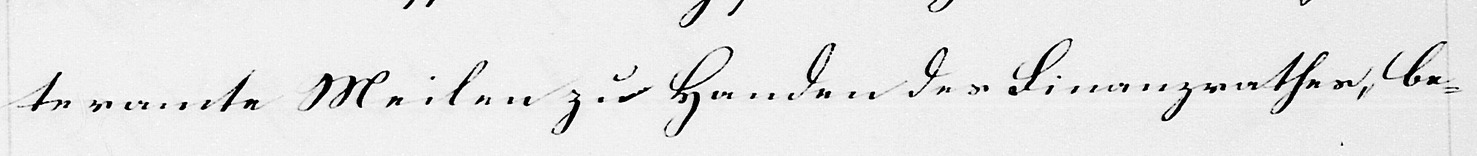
teramte Meilen zu Handen des Finanzrathes, be¬
